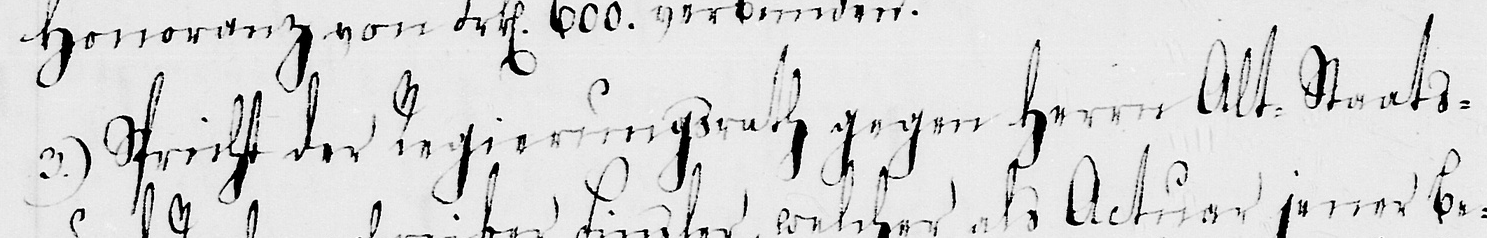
3.) Spricht der Regierungsrath gegen Herrn Alt-Staats-
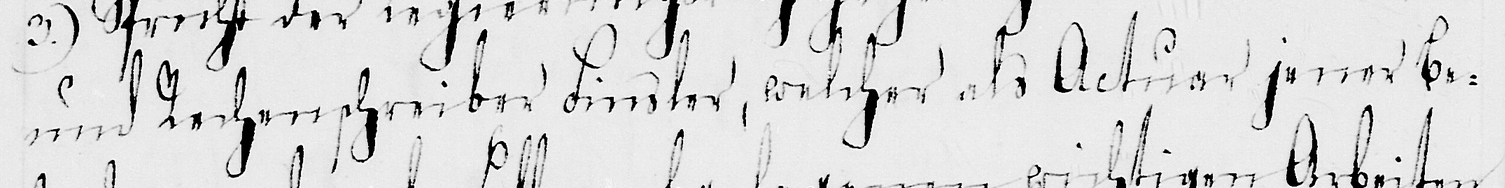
und Rechenschreiber Finsler, welcher als Actuar jener Be¬
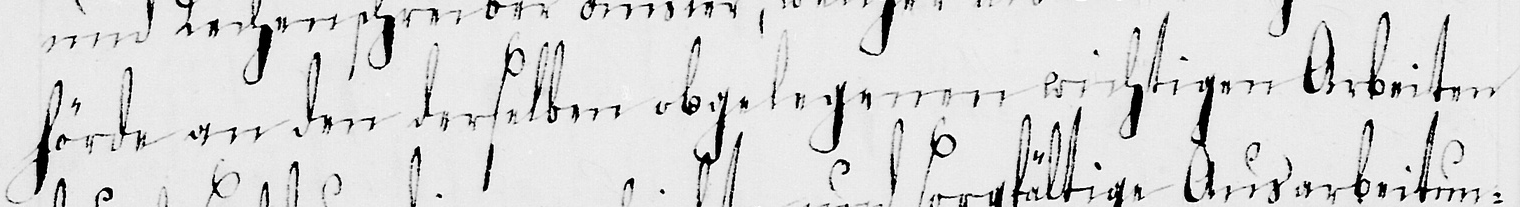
hörde an den derselben obgelegenen wichtigen Arbeiten
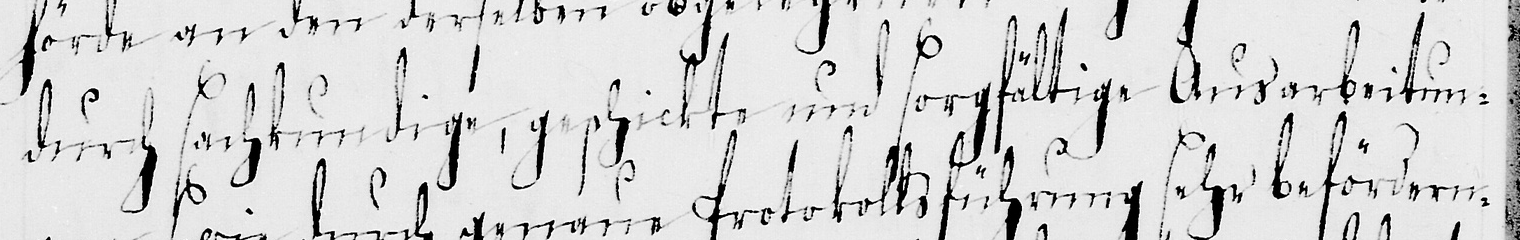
durch sachkundige, geschickte und sorgfältige Ausarbeitun¬
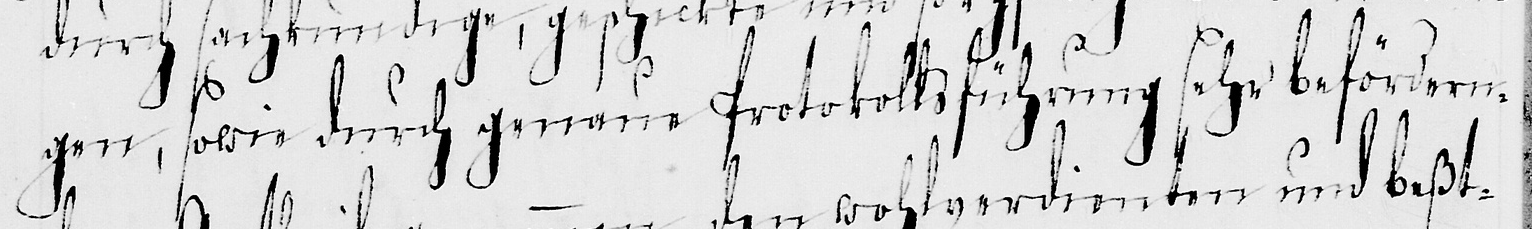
gen, sowie durch genaue Protokollsführung sehr befördern¬
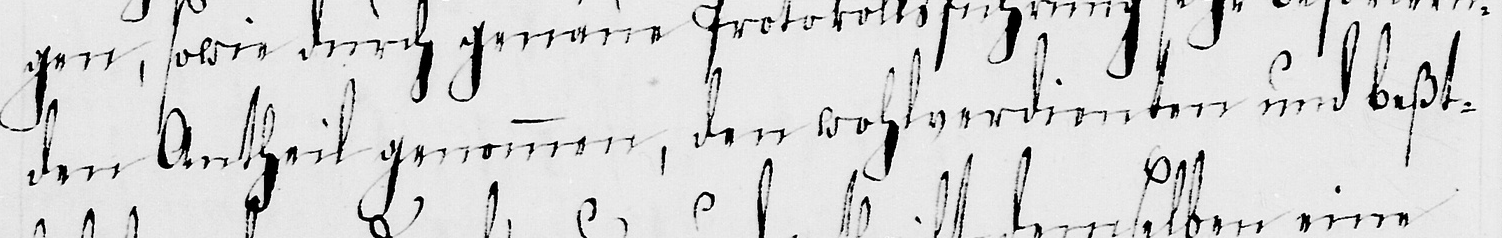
den Antheil genommen, den wohlverdienten und beßt¬
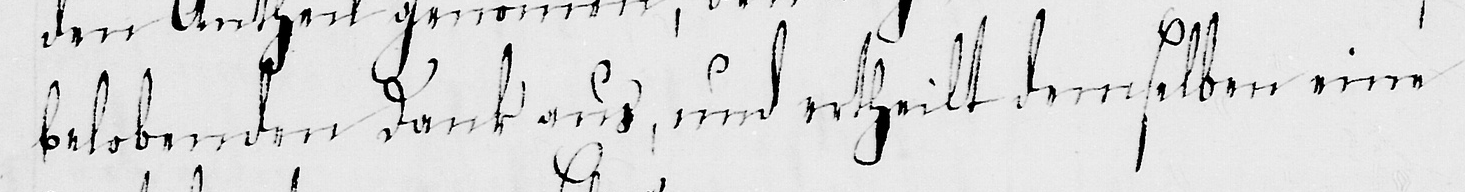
belobenden Dank aus, und ertheilt demselben eine
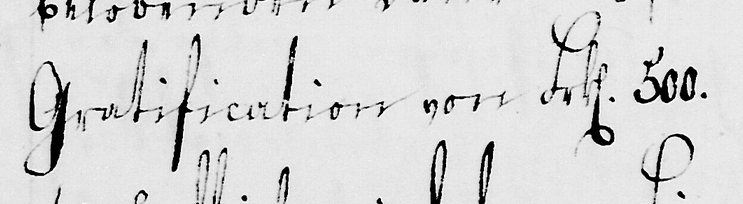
Gratification von Frk[en]. 500.
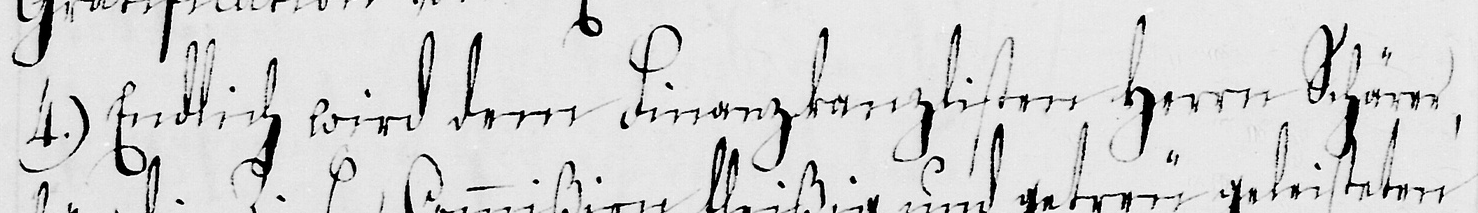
4.) Endlich wird dem Finanzkanzlisten Herrn Schärer
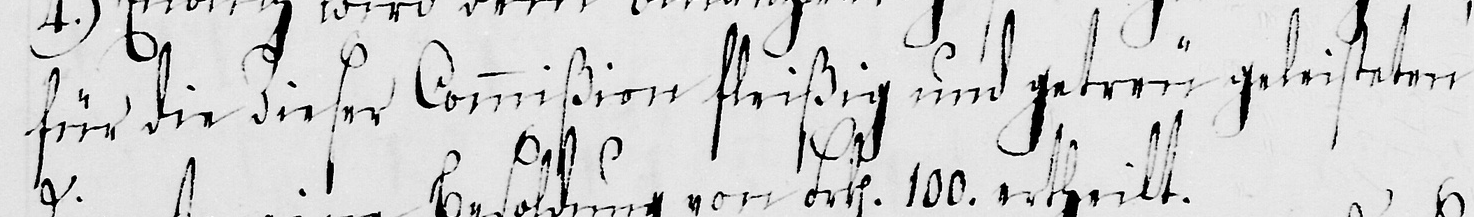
für die dieser Commißion fleißig und getreu geleisteten
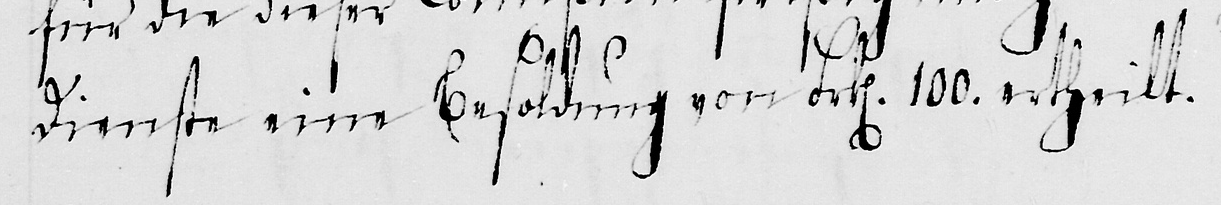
Dienste eine Besoldung von Frk[en]. 100. ertheilt.
